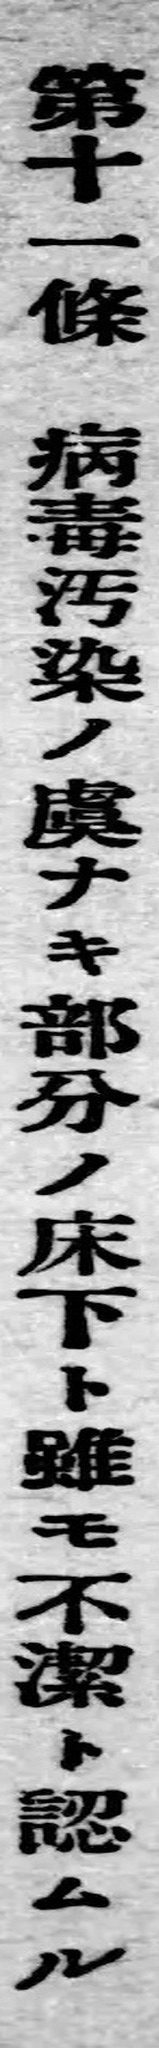第十一條病毒汚染ノ虞ナキ部分ノ床下ト雖モ不潔ト認ムル
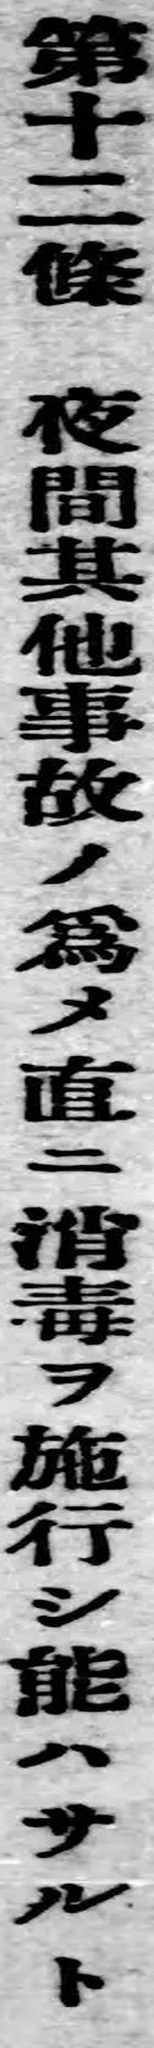第十二條夜間其他事故ノ爲メ直ニ消毒ヲ施行シ能ハサルト
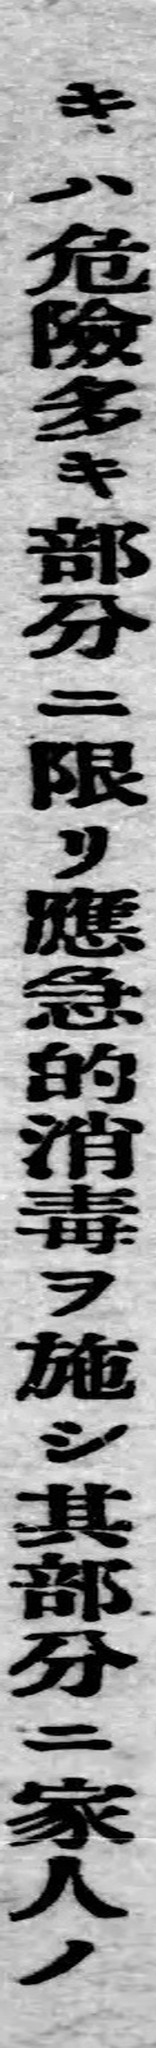キハ危險多キ部分ニ限リ應急的消毒ヲ施シ其部分ニ家人ノ
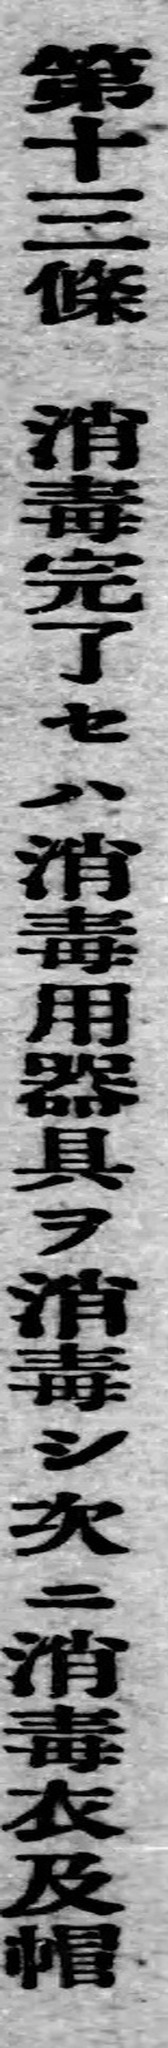第十三條消毒完了セハ消毒用器具ヲ消毒シ次ニ消毒衣及帽

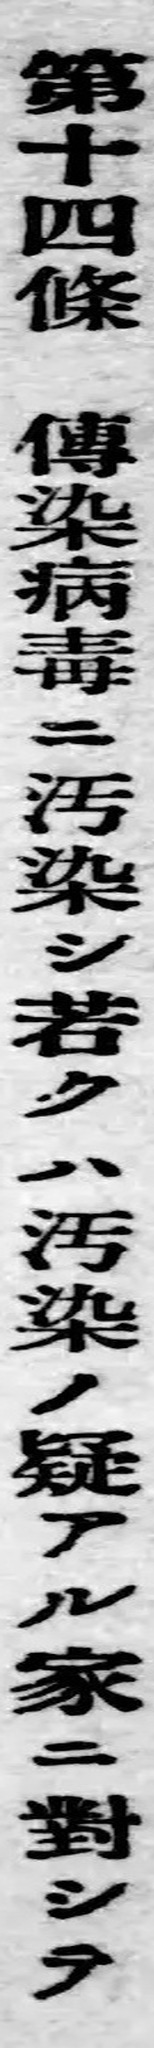第十四條傅染病毒ニ汚染シ若クハ汚染ノ疑アル家ニ對シテ
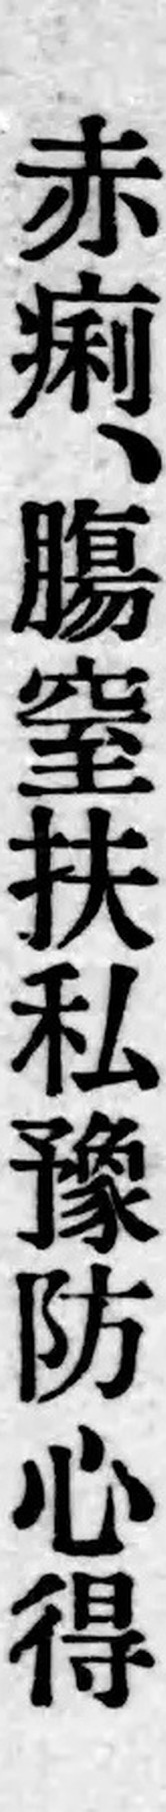赤痢、膓窒扶私豫防心得
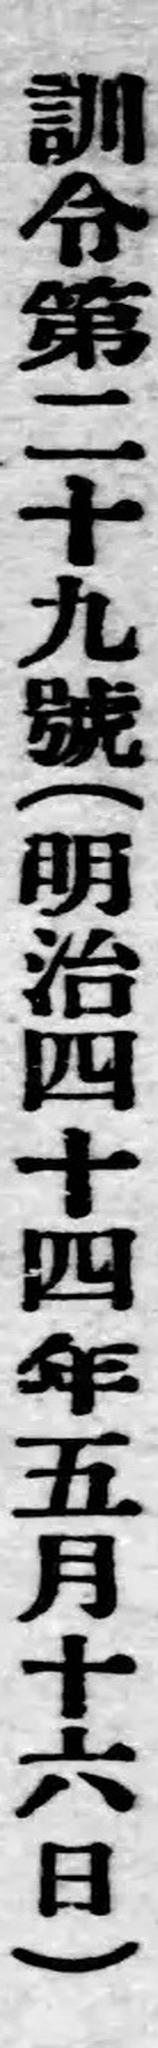訓令第二十九號(明治四十四年五月十六日)
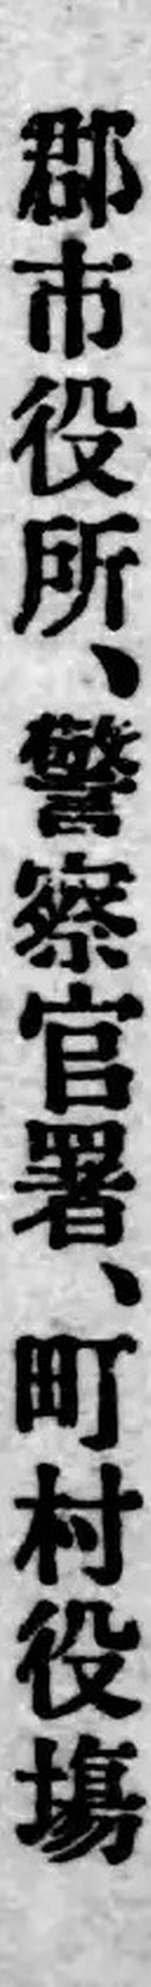群市役所、警察官署、町村役場
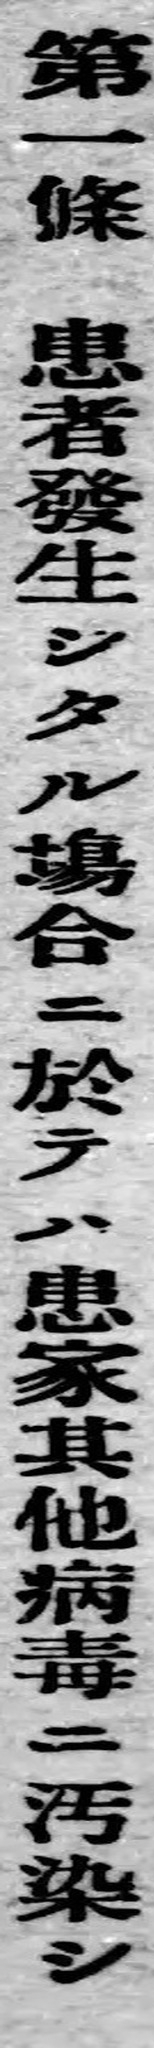第一條患者發生シタル塲合ニ於テハ患家其他病毒ニ汚染シ
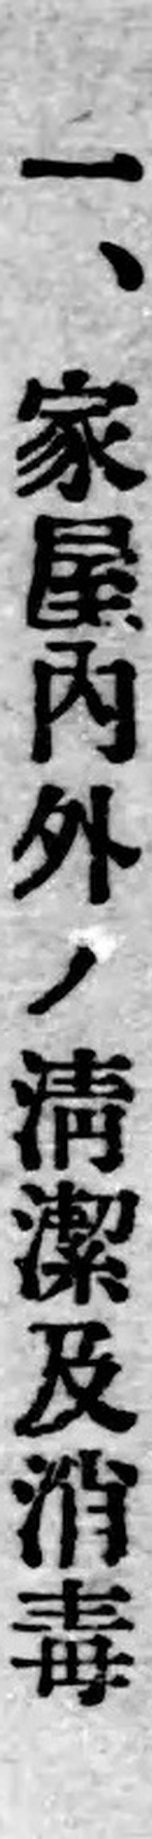一、家屋内外ノ淸潔及消毒
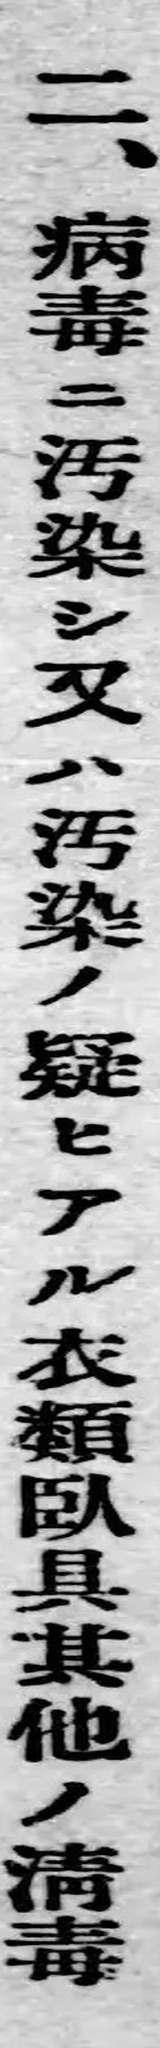二、病毒ニ汚染シ又ハ汚染ノ疑ヒアル衣類臥具其他ノ清毒
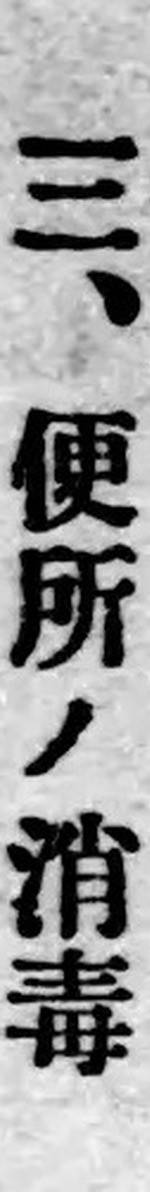三、便所ノ消毒
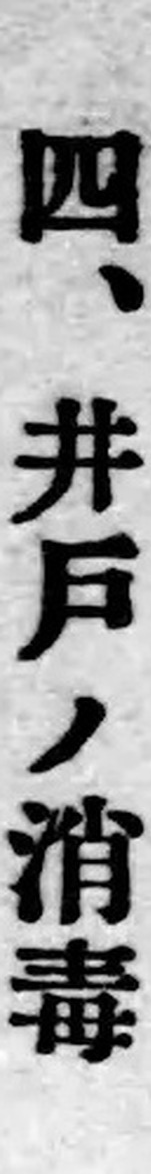四、井戸ノ消毒
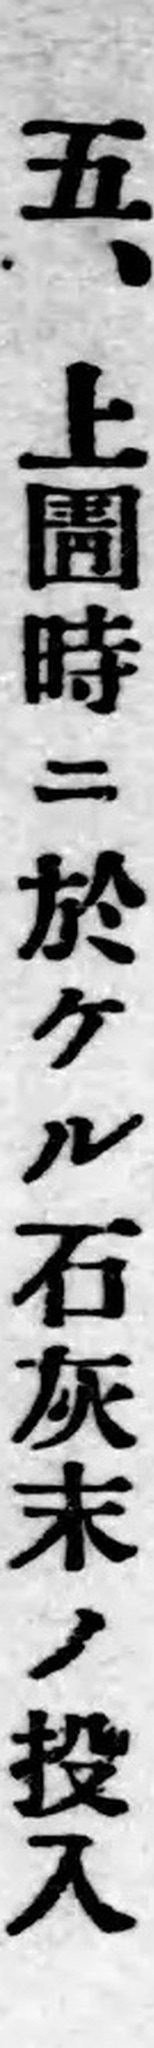五、上圊時ニ於ケル石灰末ノ投入
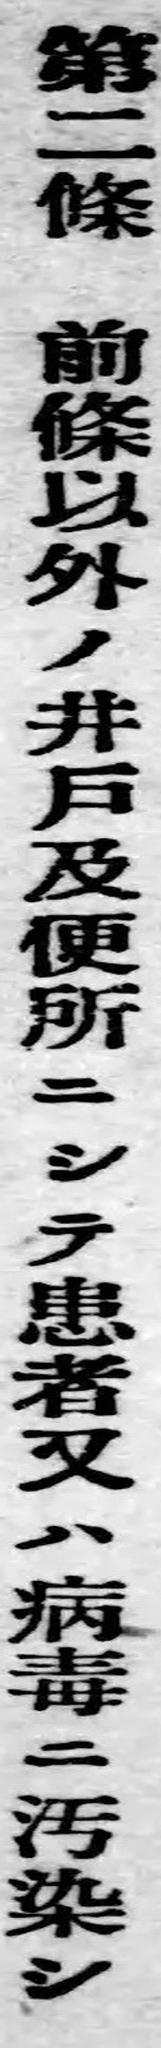第二條前條以外ノ井戸及便所ニシテ患者又ハ病毒ニ汚染シ
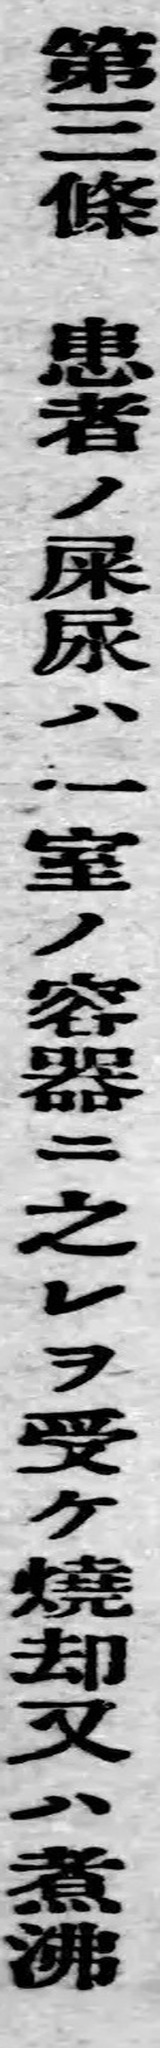第三條患者ノ屎尿ハ一室ノ容器ニ之レヲ受ケ燒却又ハ煮沸
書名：袖珍防疫必携
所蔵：国立国会図書館 National Diet Library, JAPAN
